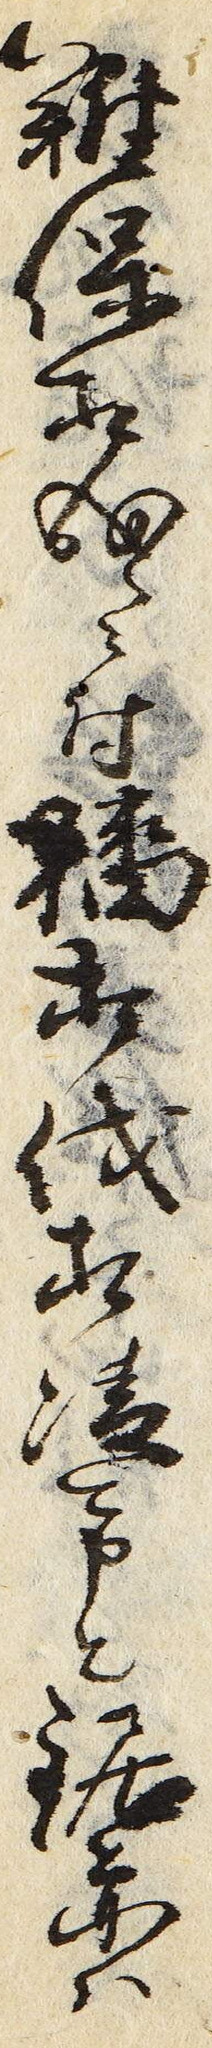難保相成候ニ付檣相伐相凌可申と鋸亦ハ
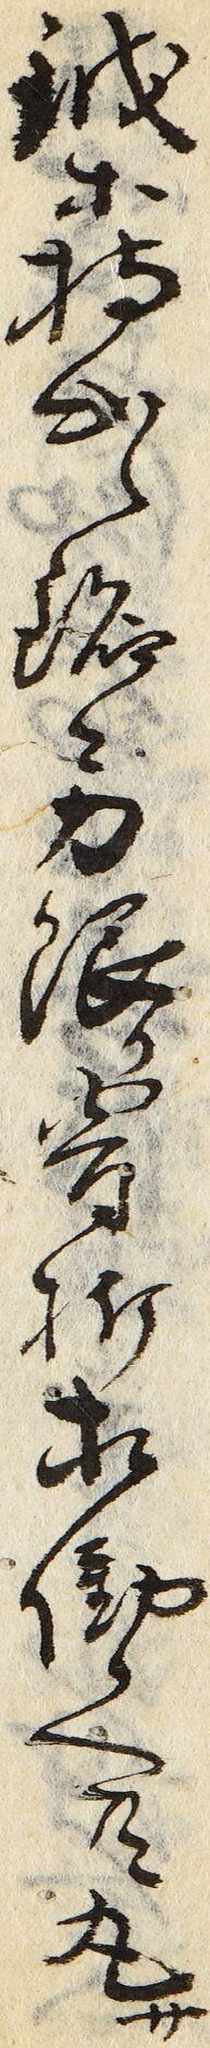鉞等持出し銘々力限り骨折相働候へ共丸サ
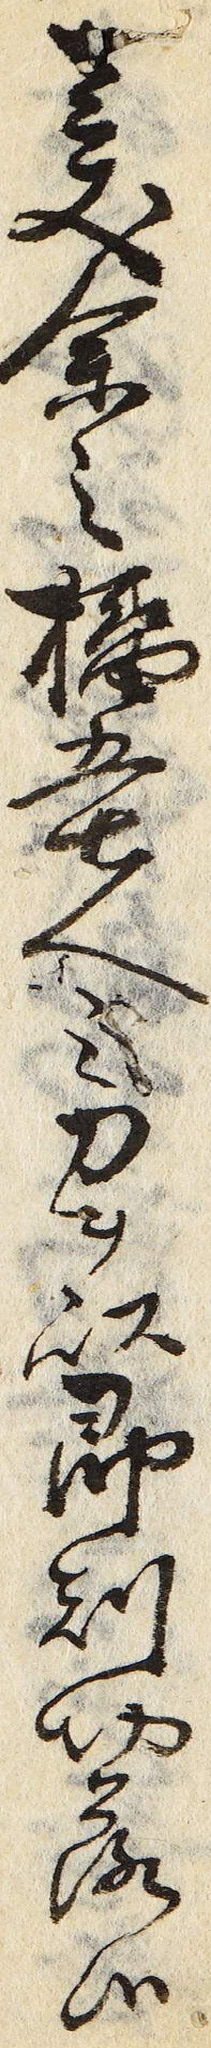壱丈余之檣五七人之力ヲ以即刻切落候
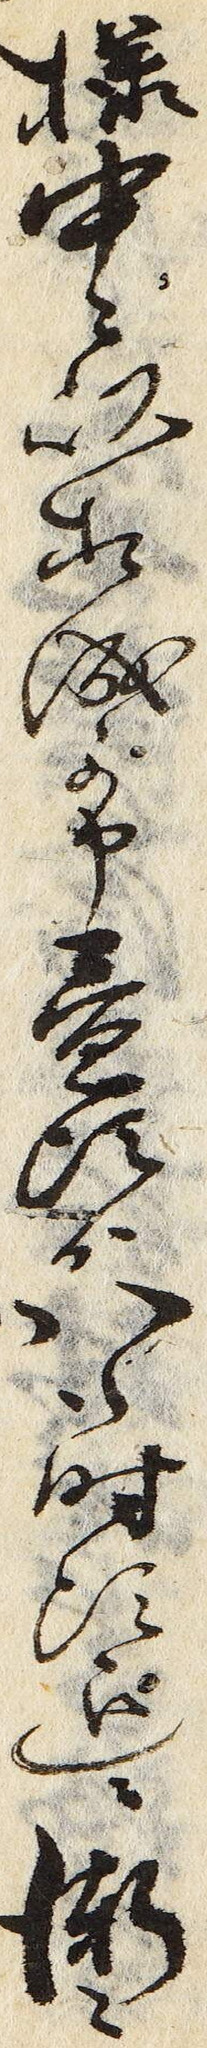様中々以相成不申昼頃ゟ八ツ時頃迄ニ漸々
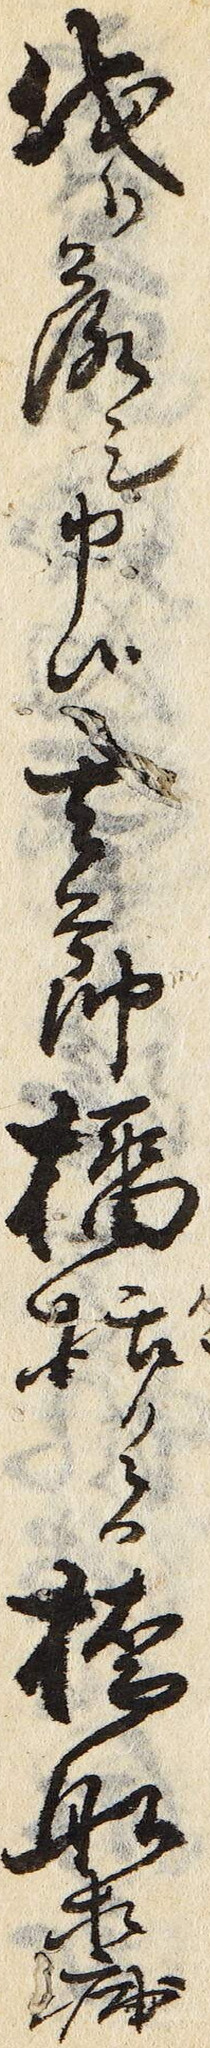伐り落シ申候其節檣括りニ而橋船相痛
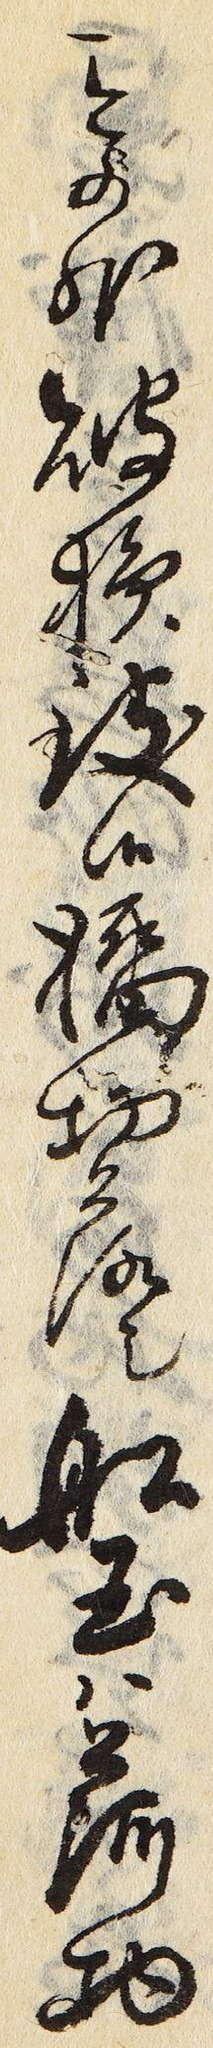ことの外破損致候檣切落シ船玉ハ荷物
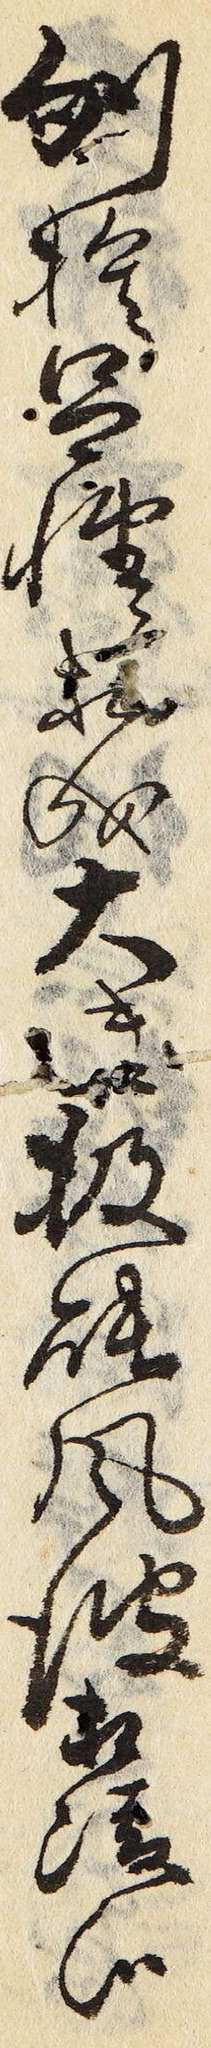刎捨足軽ク相成大キニ扱能風波相凌候
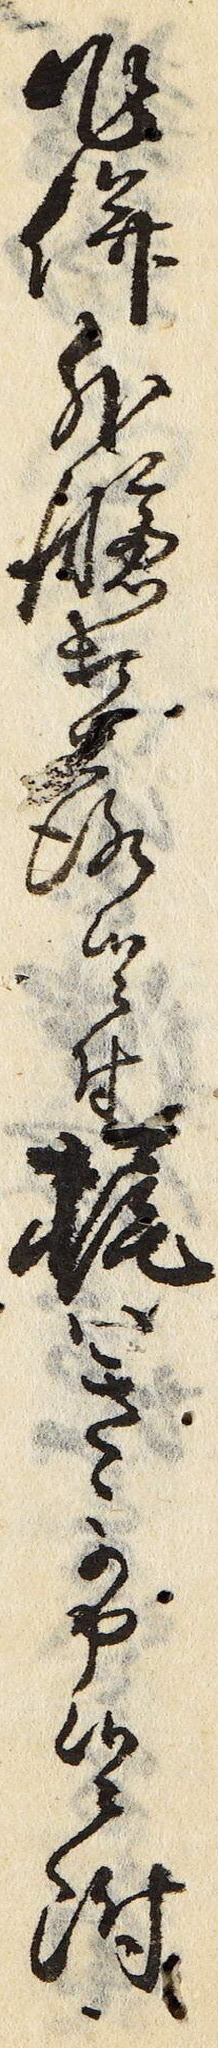乍併外艫打落候ニ付梶ハきゝ不申候ニ付
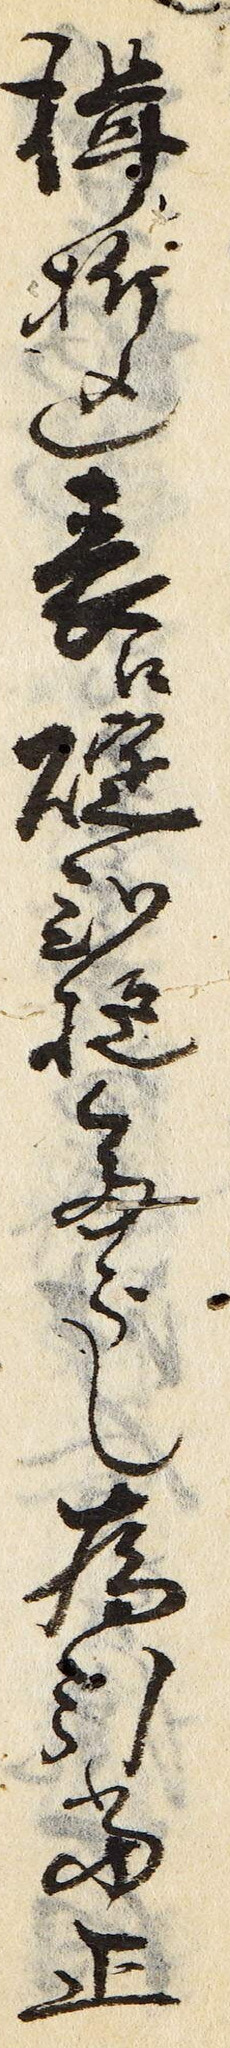楫折込表江碇弐挺たらし為引当正
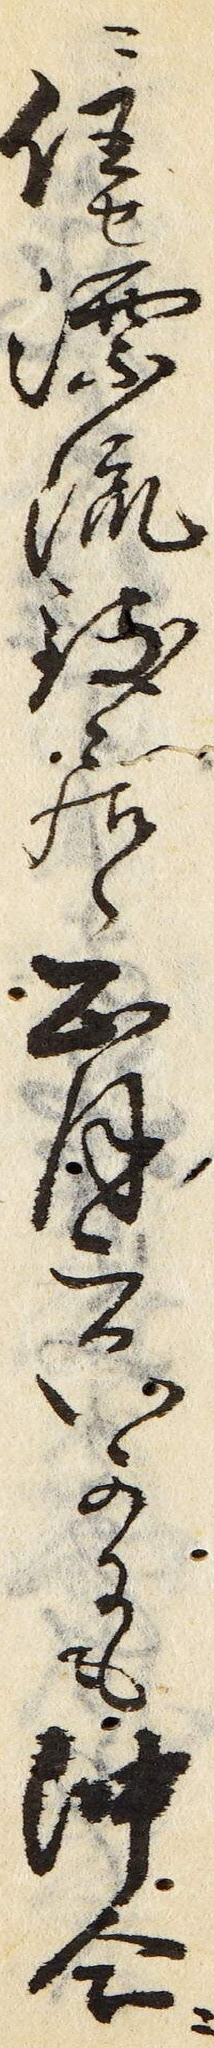ニ任せ漂流致居候正月二日いかにも沖合ニ
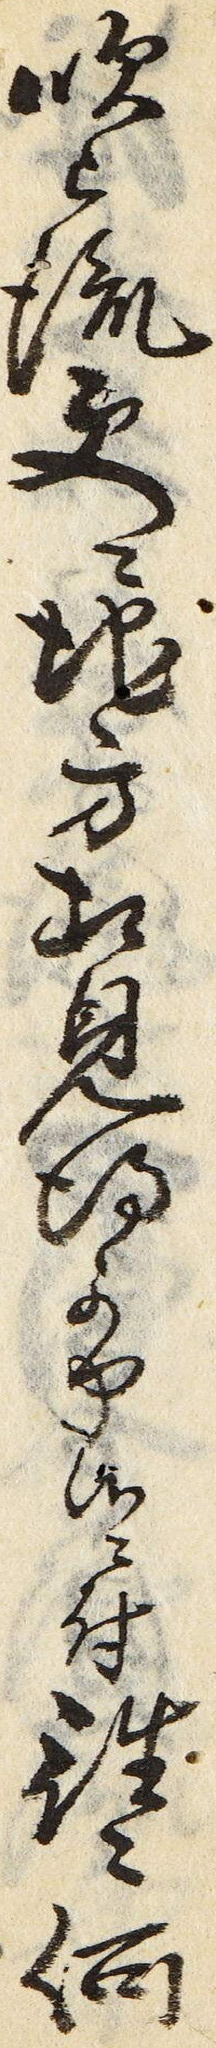吹被流更ニ地方相見得不申ニ付往々何
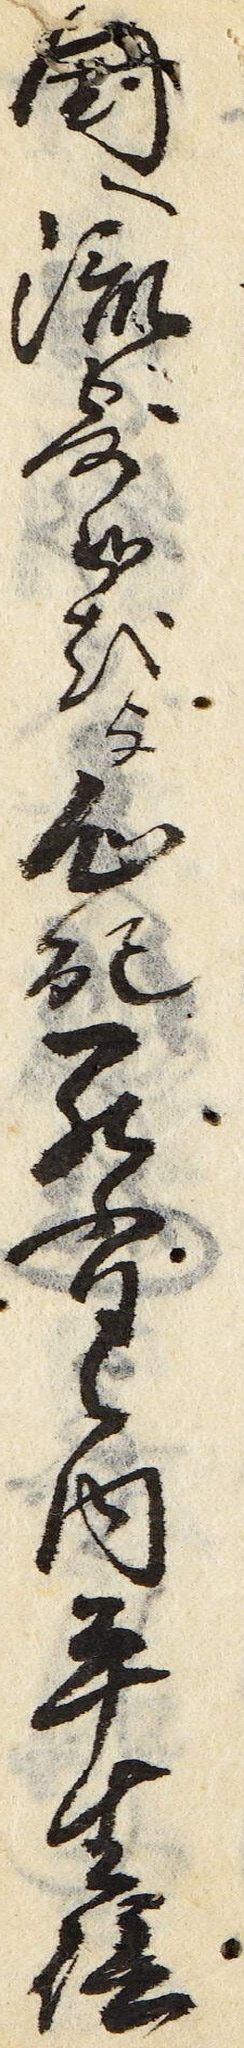国へ流寄候哉与心配罷有候内平生信
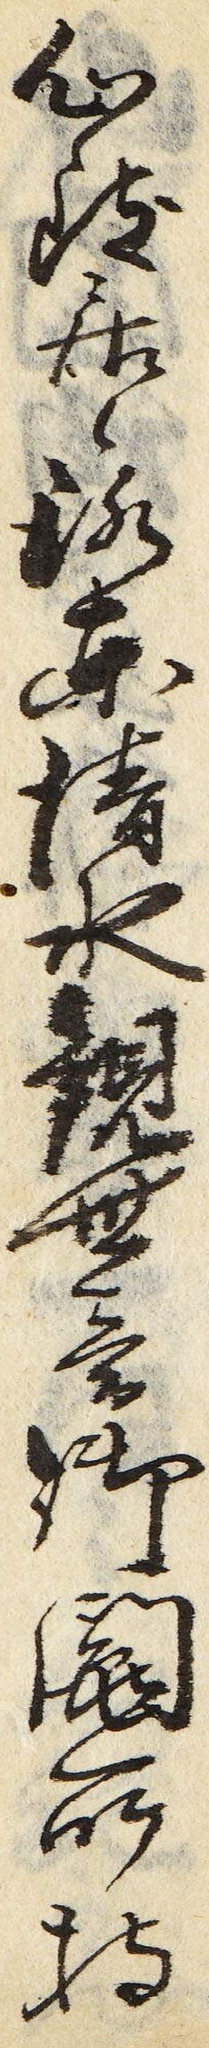心致居候洛東清水観世音御鬮所持
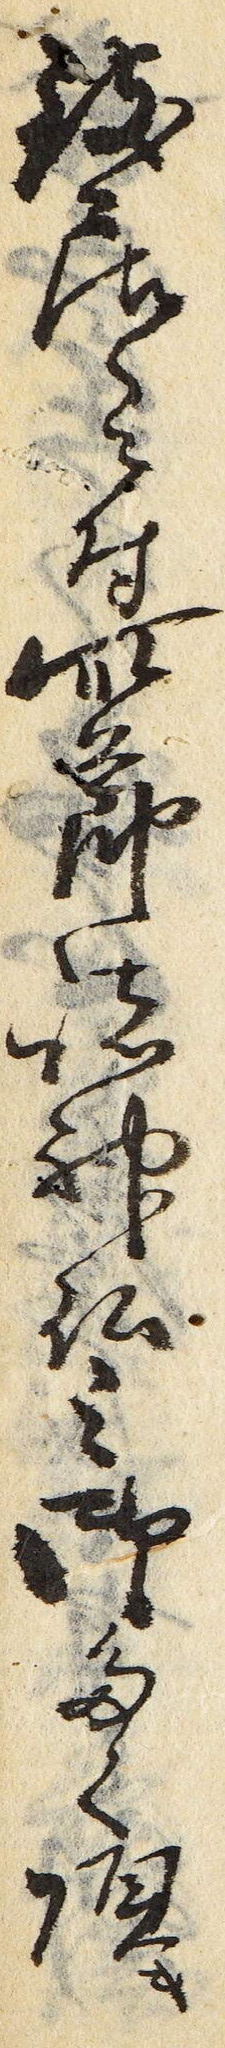致居候ニ付此節諸神仏之御たく頂キ

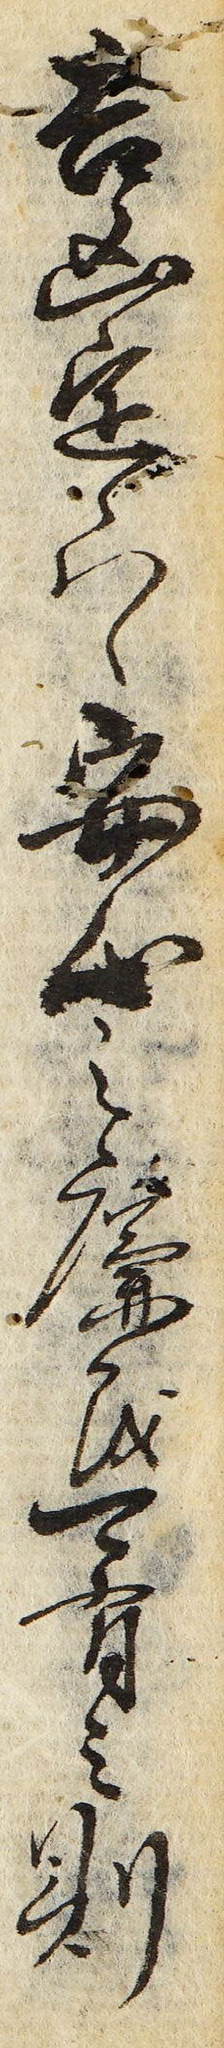吉凶定候ハヽ安心之廉も可有之則
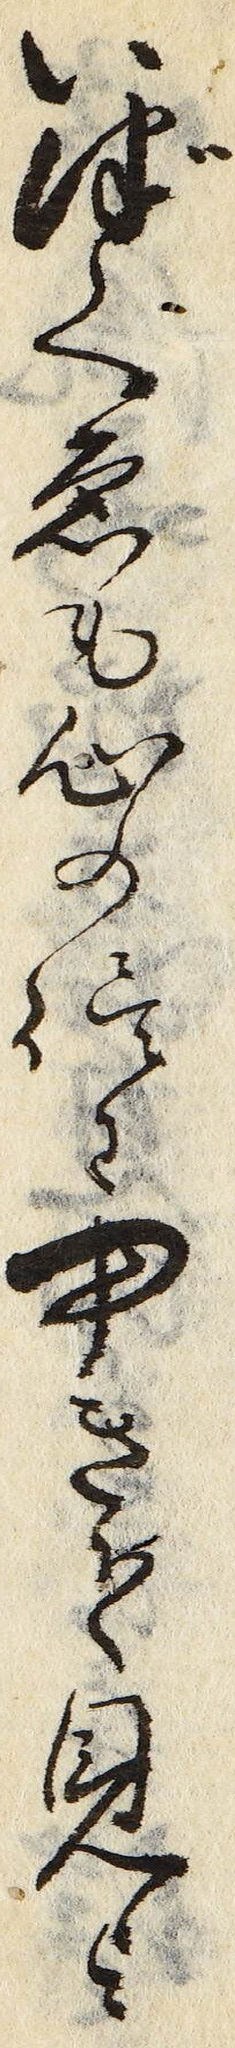いづくゑも心の儘にゆきて見よ
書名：阿波幸宝丸漂流記
